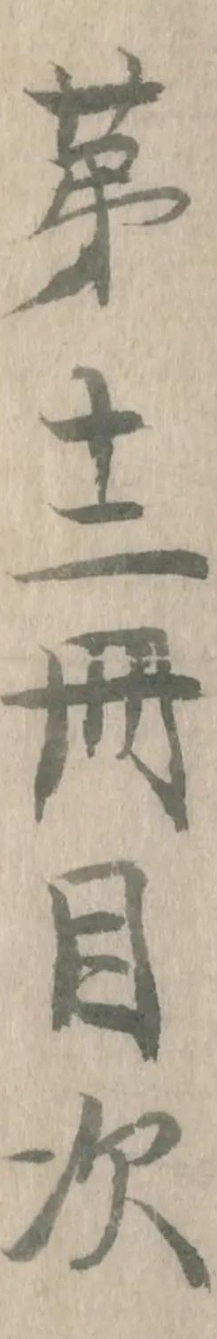第十二册目次
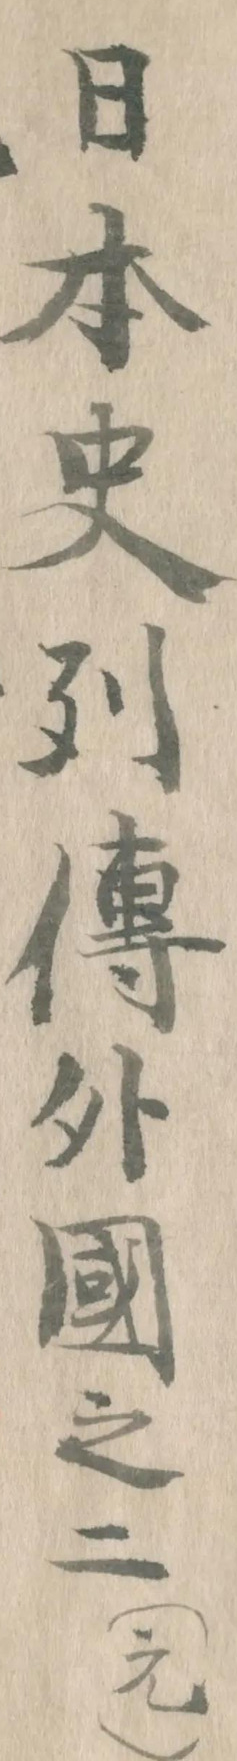日本史列伝外国之二(元)
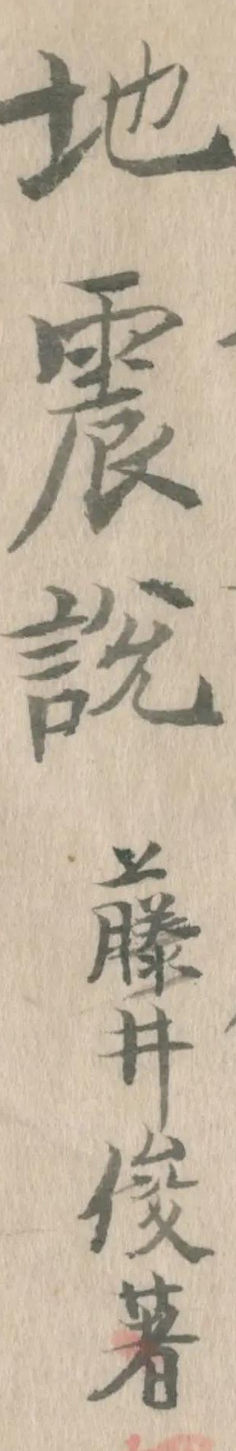地震説藤井俊著訳
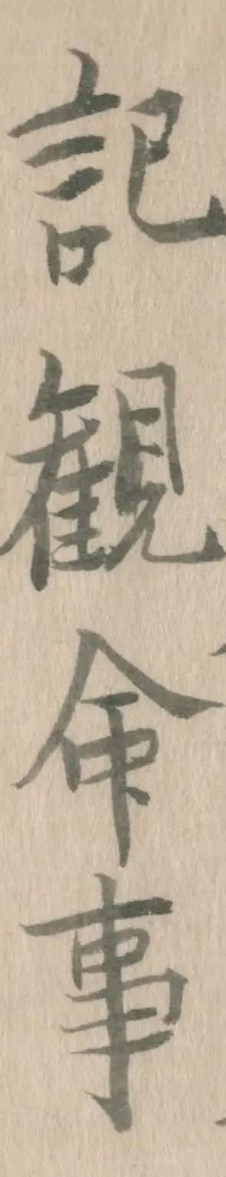記観命事
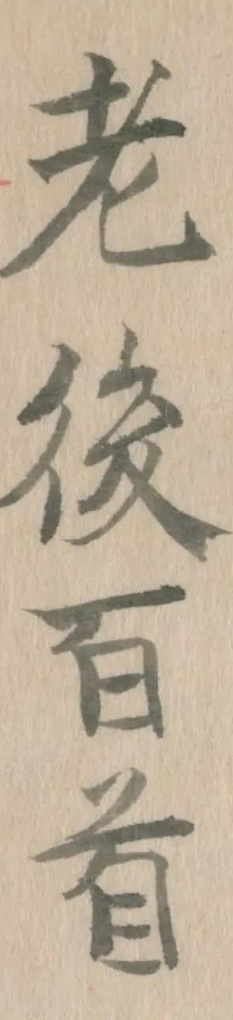老後百首
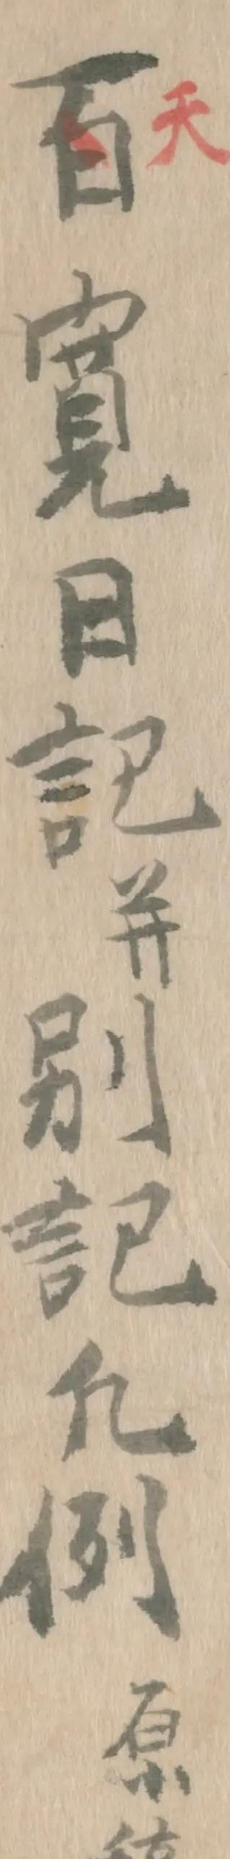百天寛日記并別記凡例原稿

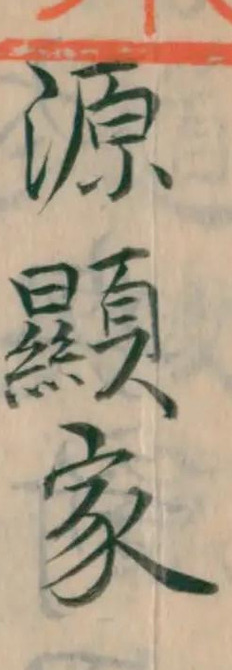源顕家
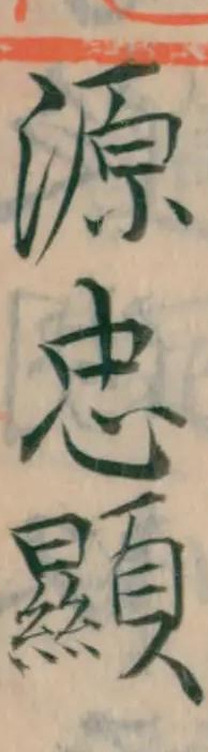源忠顕
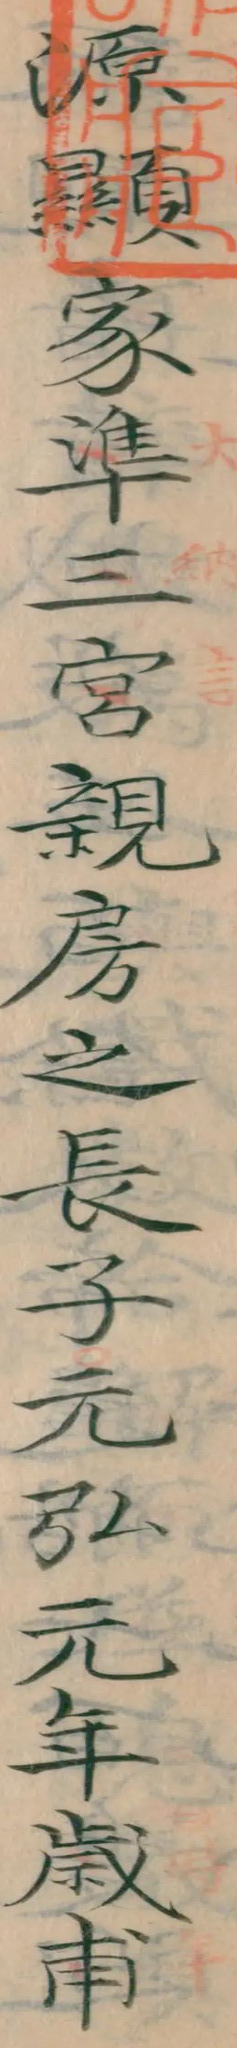源顕家準三宮親房之長子元弘元年歳甫
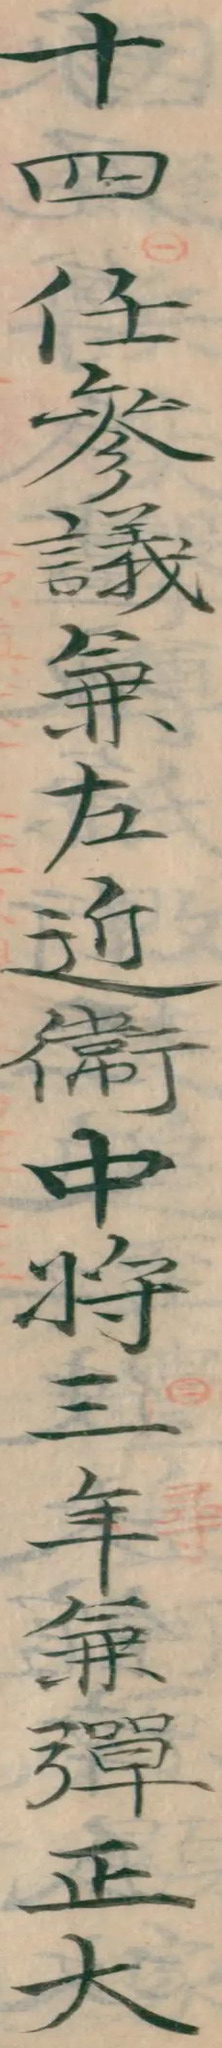十四任参議兼左近衛中将三年兼弾正大
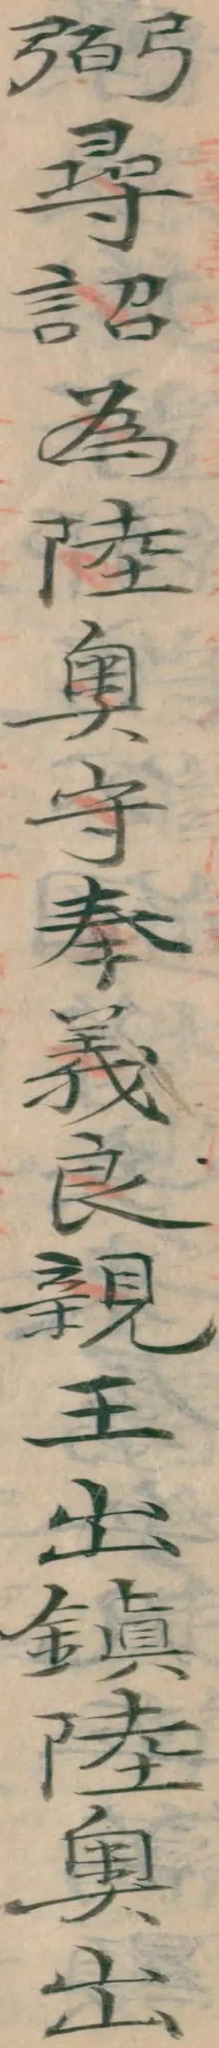弼尋詔為陸奥守奉義良親王出鎮陸奥出
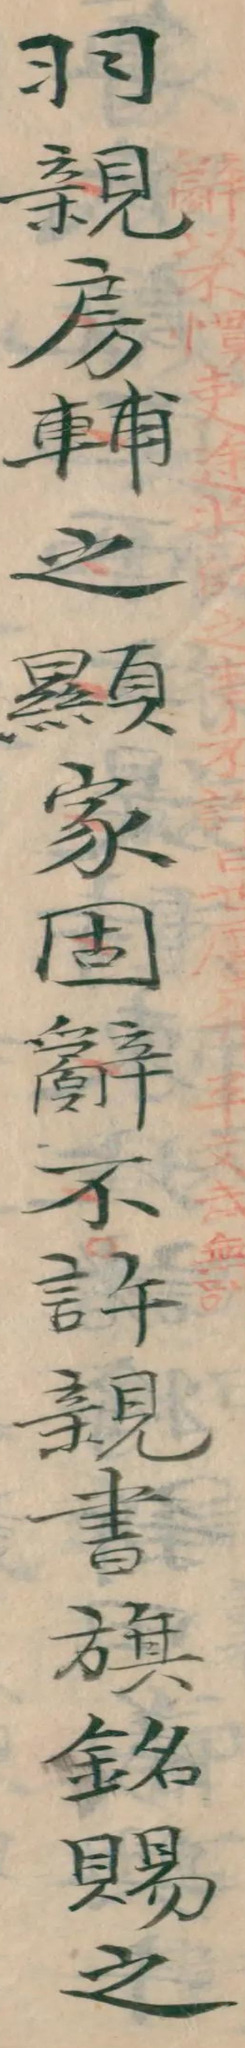羽親房輔之顕家固辞不許親書旗銘賜之
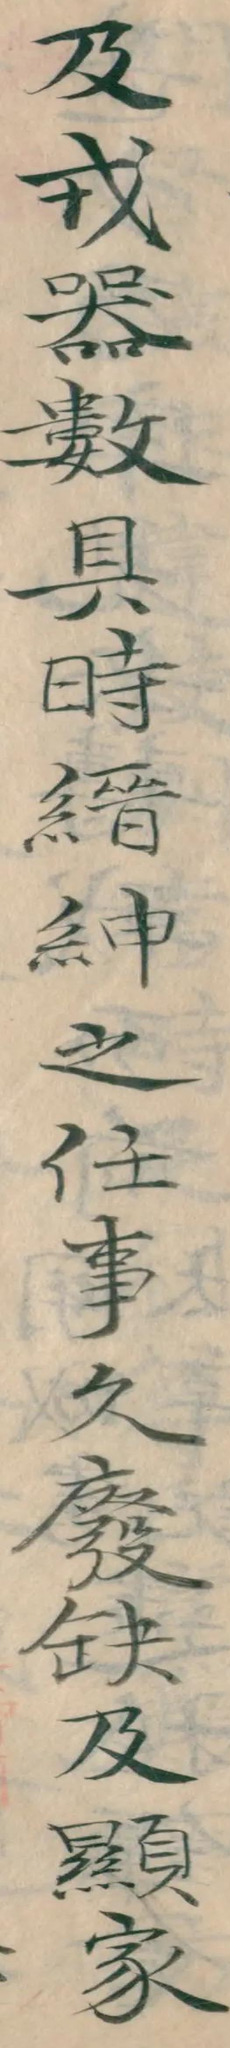及戎器数具時縉紳之仕事久廃欠及顕家

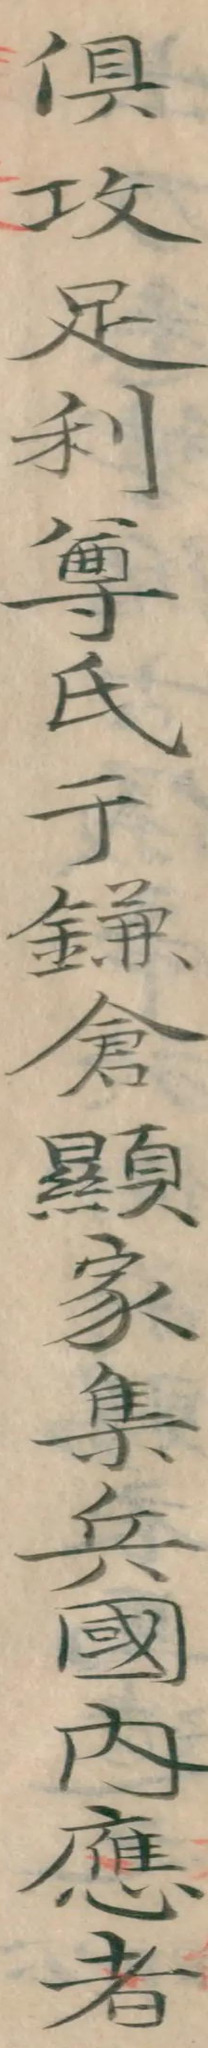俱攻足利尊氏于鎌倉顕家集兵国内応者不能
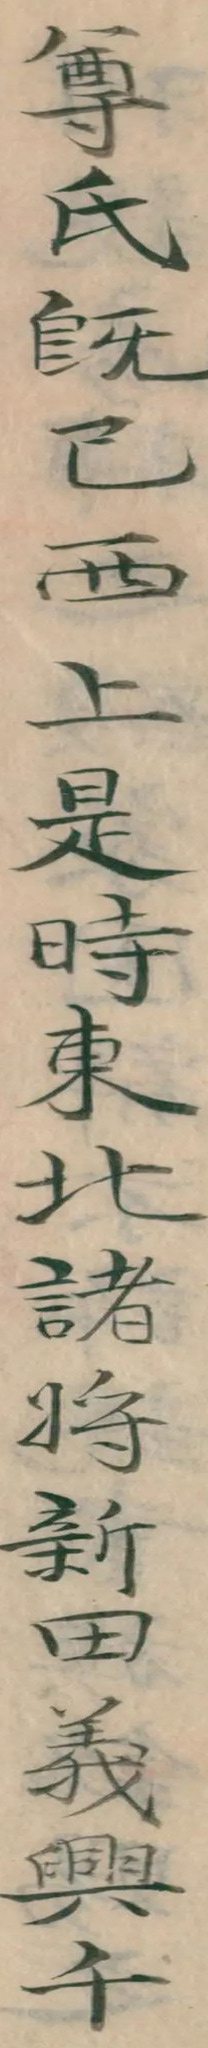尊氏既已西上是時東北諸将新田義興千
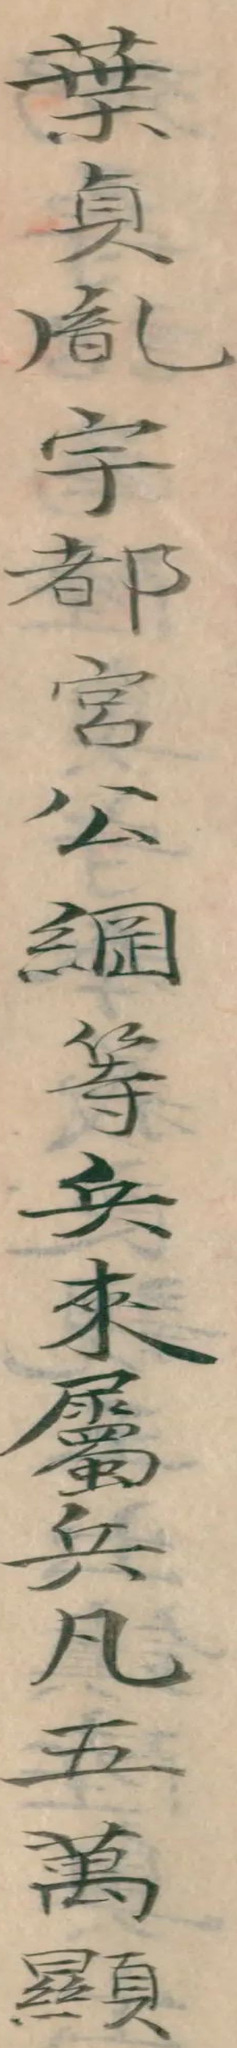葉貞胤宇都宮公綱等兵来属兵凡五万顕
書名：輪池叢書. 12
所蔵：国立国会図書館 National Diet Library, JAPAN
